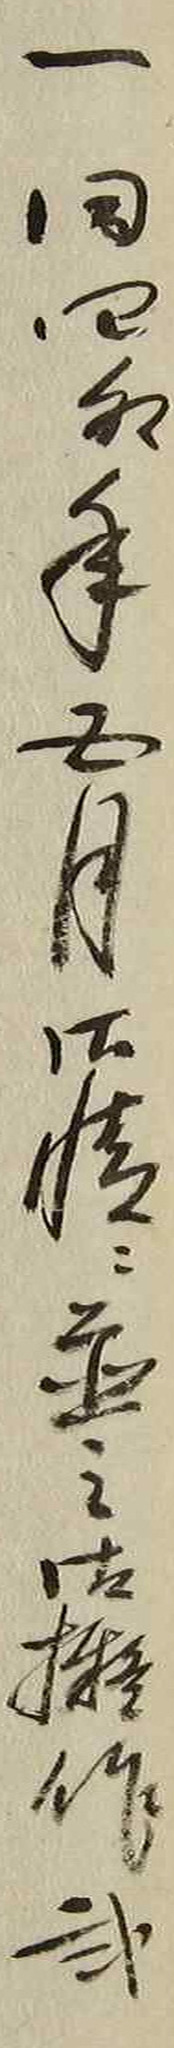一同四卯年五月御情ニ並之御擬作弐
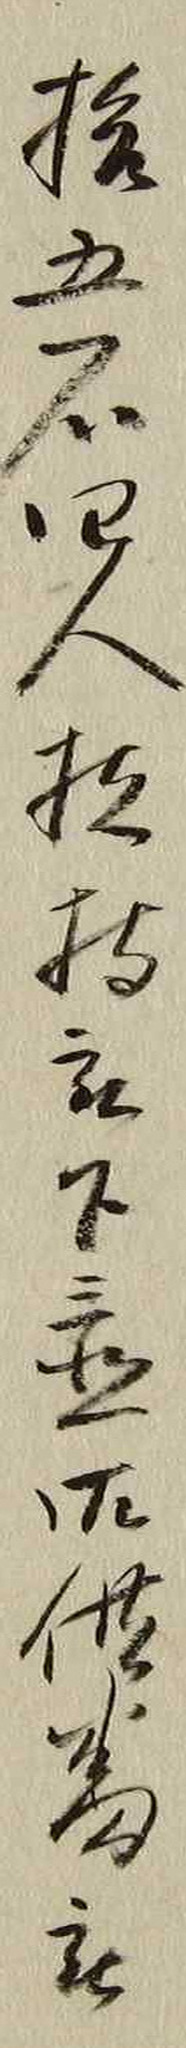拾五石四人扶持被下置御供番被
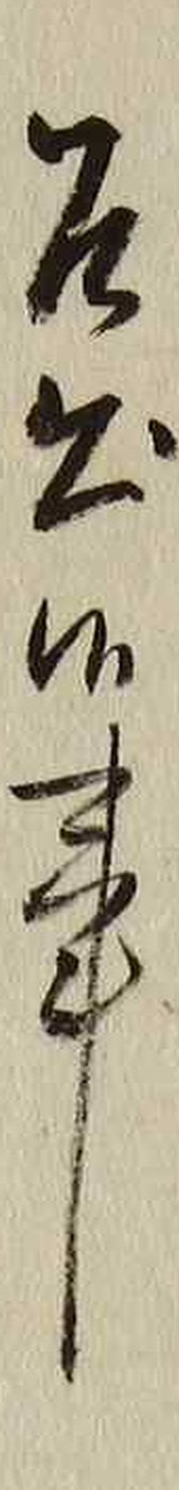召出候事
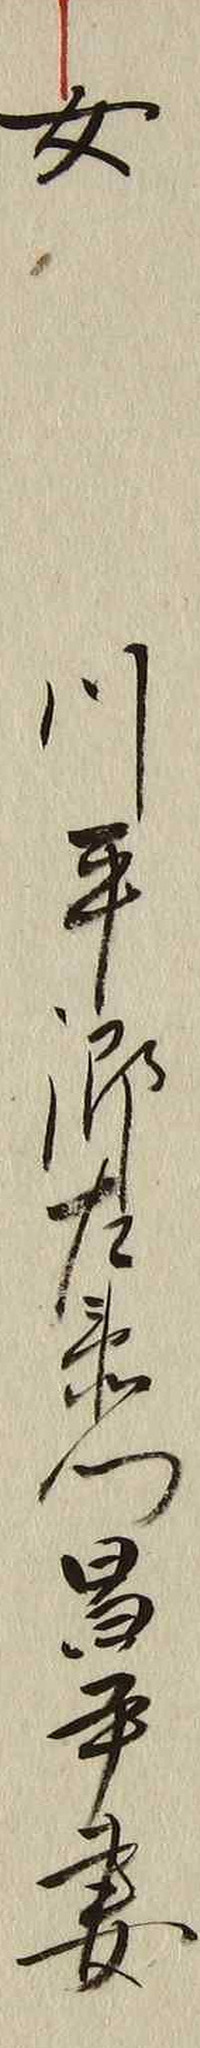女川平郷左衛門昌尹妻
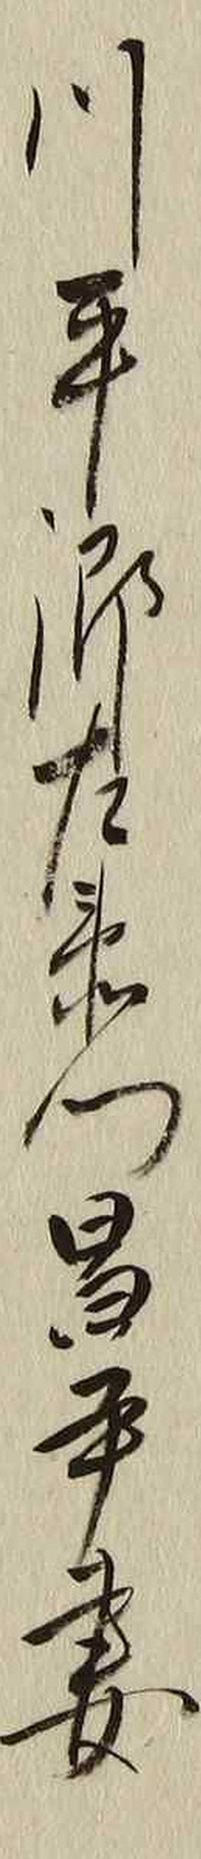女川平郷左衛門昌尹妻
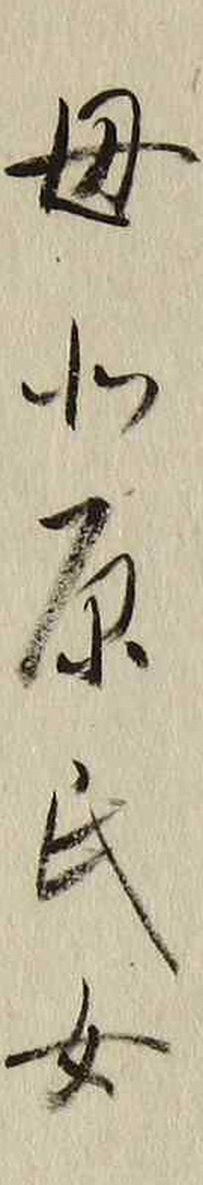母北原氏女
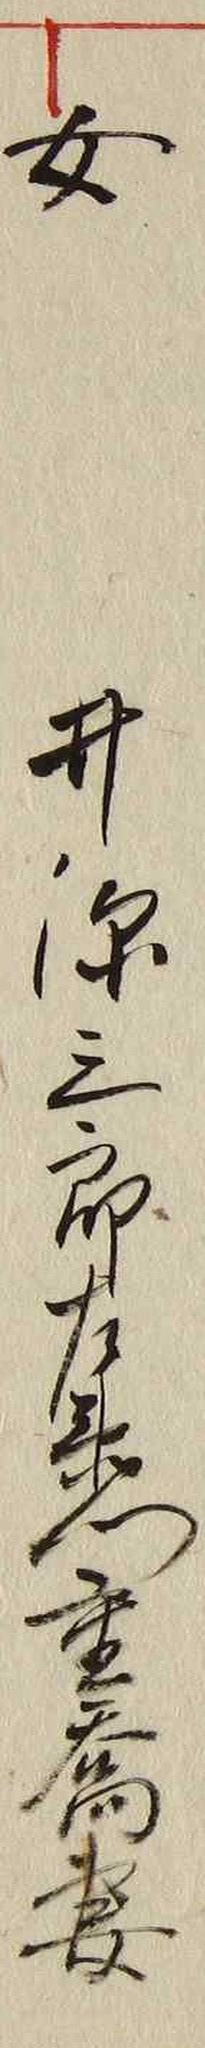女井深三郎左衛門重喬妻
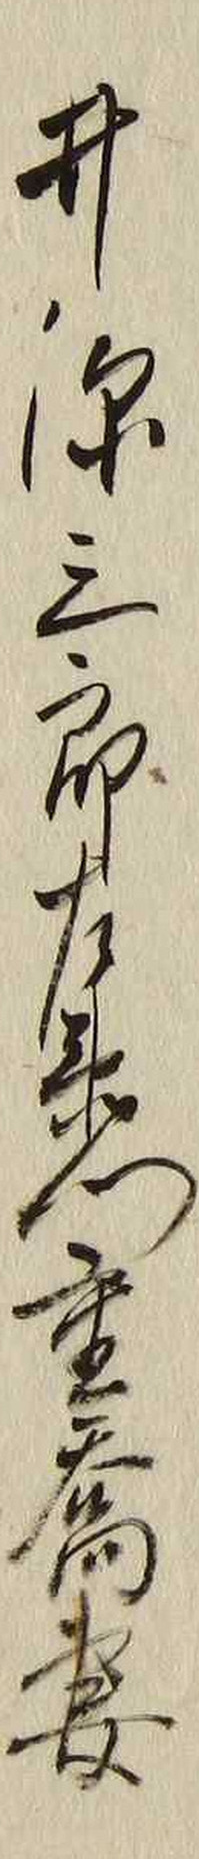女井深三郎左衛門重喬妻
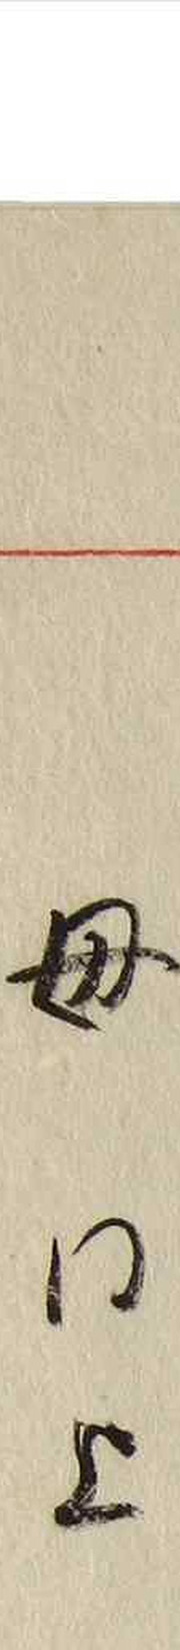母同上
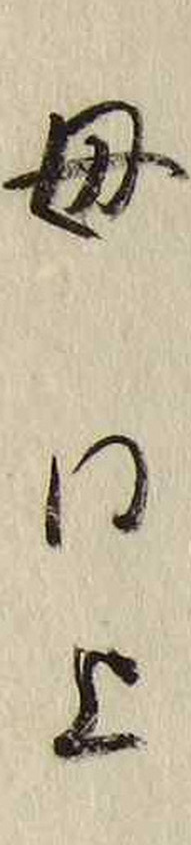母同上

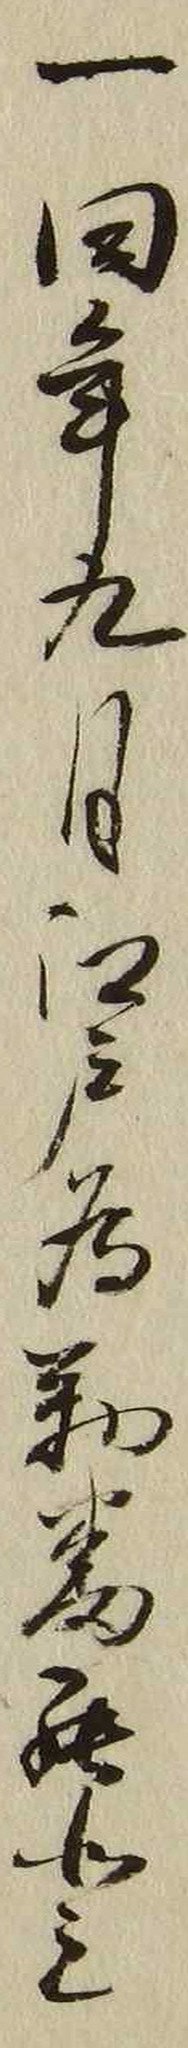一同年九月江戸為勤番罷登
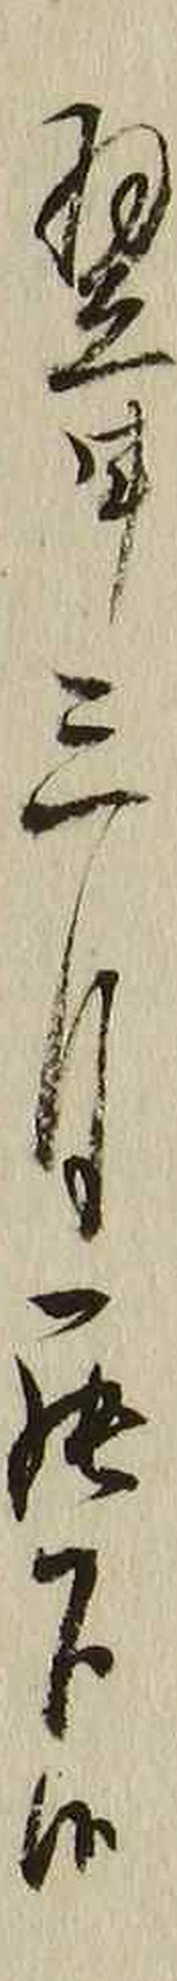翌申三月罷下候
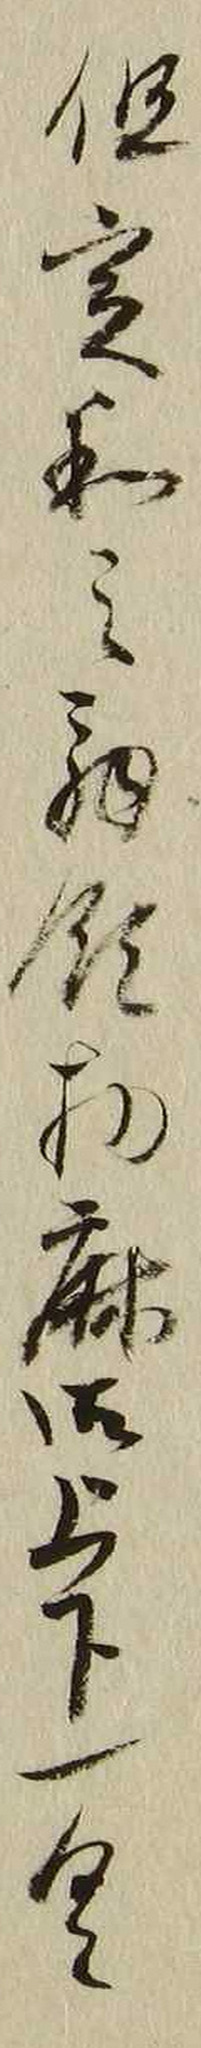但定和之拝領物麻御上下一具
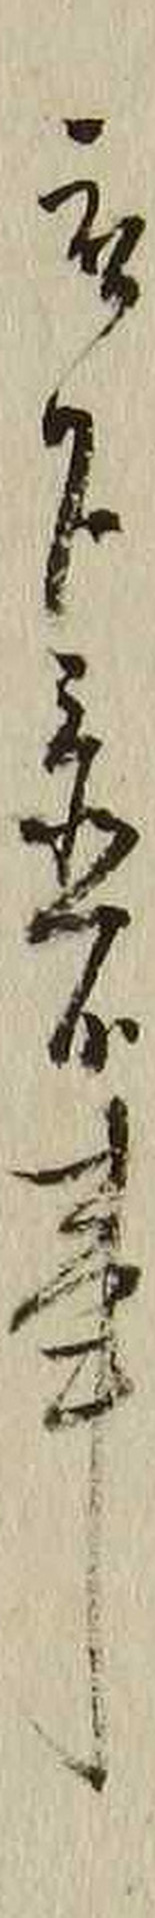被下置候事
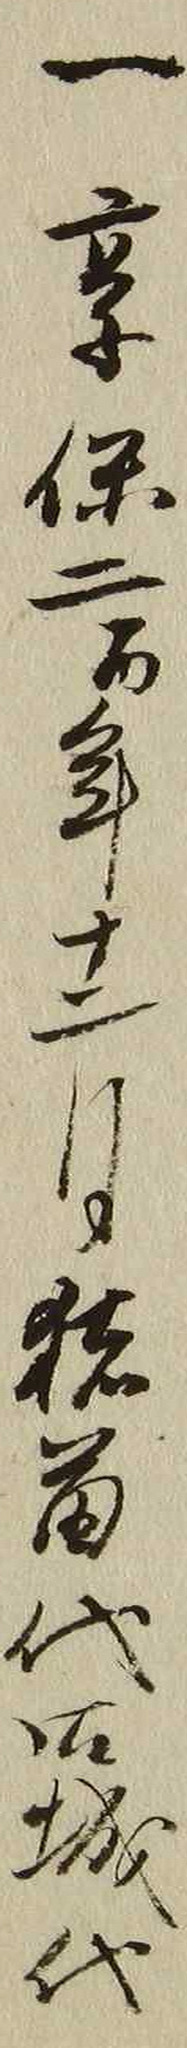一享保二酉年十二月猪苗代御城代
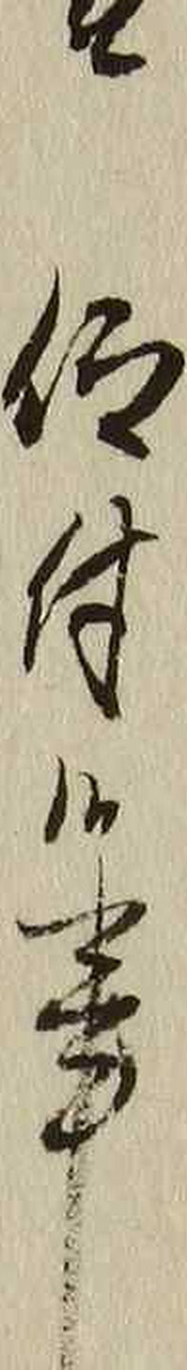被仰付候事
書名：諸士系譜　巻之351　す之部1
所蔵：会津若松市立会津図書館
